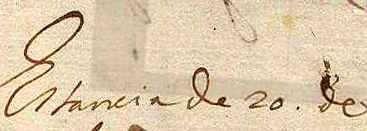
Estancia de 20. de
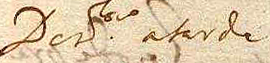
Dez.bro a tarde
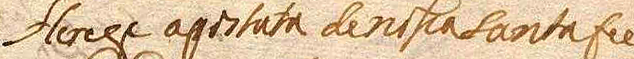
Herege apostata de nossa santa fee
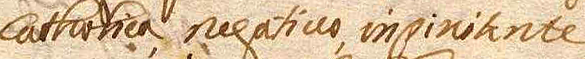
Catholica, negatiuo, inpinitente
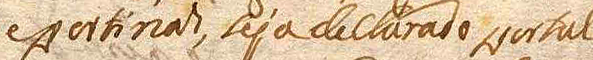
e pertinas, seja declarado por tal
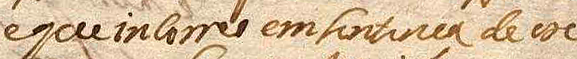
e que incorreo em sentença de ex
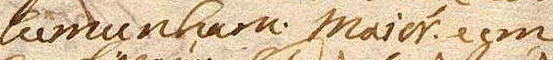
cumunham. maior. e em
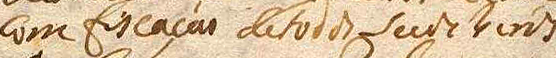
comfiscação de todos seus bens
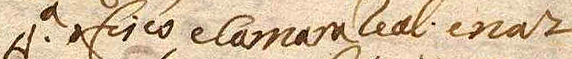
p.a o fisco, e Camara Real. e nas
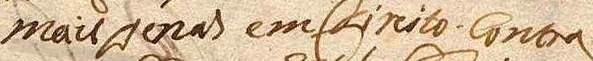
mais penas em Direito. contra
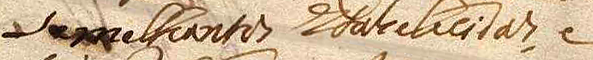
semelhantes Estabelecidas, e
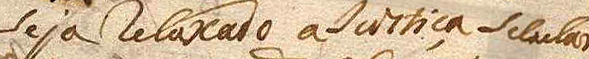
seja Relaxado a Iustiça secular
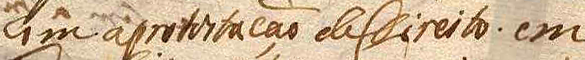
com a protestação de Direito. em
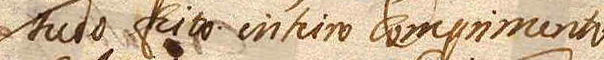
tudo feito inteiro comprimento
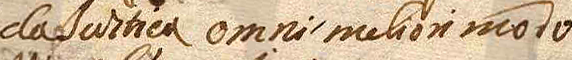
da Iustiça omni meliori modo
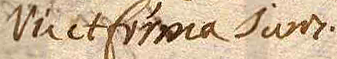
via et forma Iuris.
